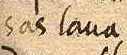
sas laua
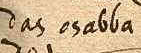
das o sabba
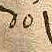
do
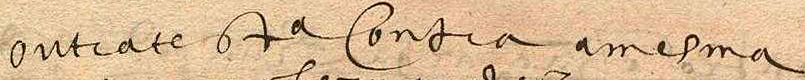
outra testa Contra a mesma
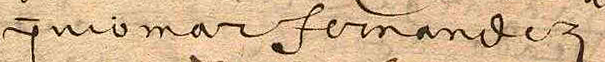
Guiomar fernandez
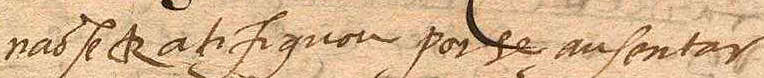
naõ se Ratifiquou por se ausentar
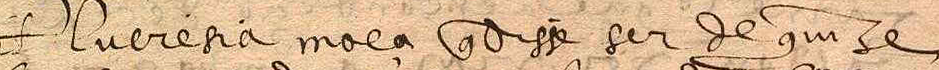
P Lucresia moça q̄ disse ser de quīze
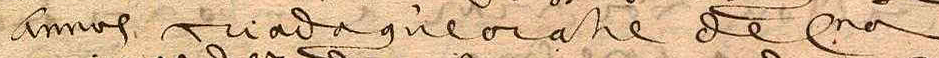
annos criada que ora he de Cna
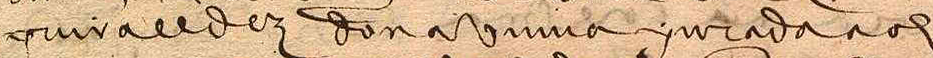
guiralldez dona viuua yurada aos
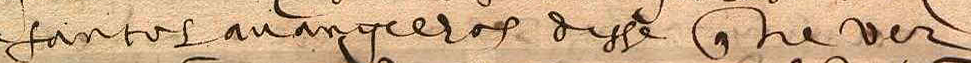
santos auangelhos disse q̄ he ver
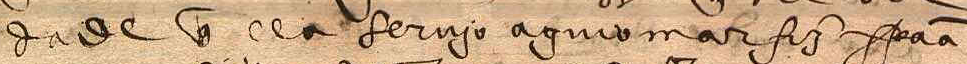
dade q̄ ela serujo a guiomar frz̄ xpāa
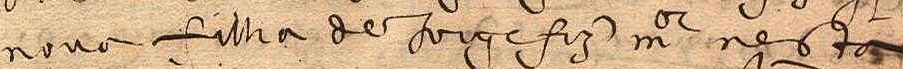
noua filha de Jorge frz̄ mor nesta
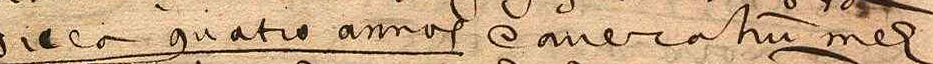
villa quatro annos e auera hū mes
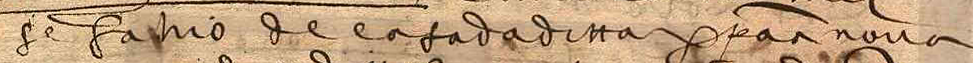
q̄ se sahio de casa da ditta xpāa noua
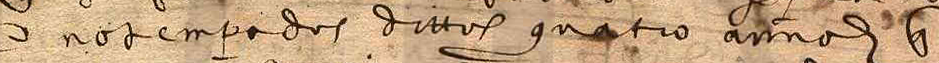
e no tempo dos dittos quatro annos q̄
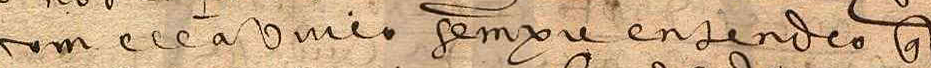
com ella viueo sempre entendeo q̄
